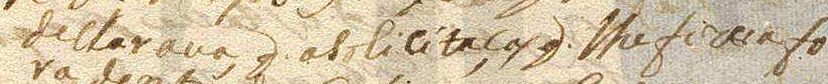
declaraua, q̄ a solicitaçaõ q̄ lhe fizera fo
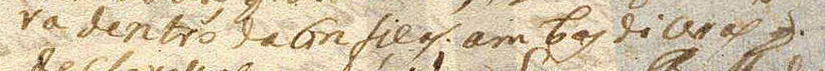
ra dentro da confiçaꝭ. ambas diceraꝭ q̄.
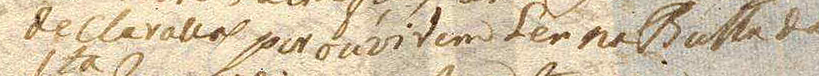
declarauaꝭ por ouvirem Ler na Bulla da
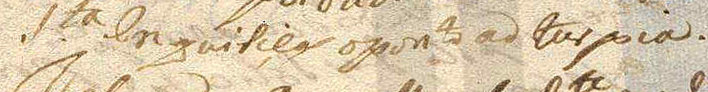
s.ta enquisiçaꝭ o ponto ad turpia.
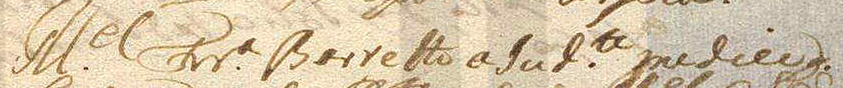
M.el Frr.a Barretto a Iud.te me dice q̄.
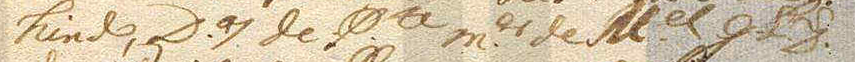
hindo, D.as de P.te m.er de M.el gLz̄.
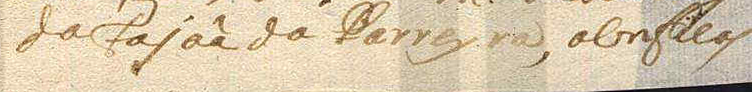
da Fajaâ da Parreyra, a confiçaꝭ
